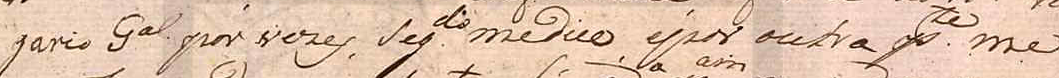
gario Gal por vezes, seg.do me dice e por outra p.te me
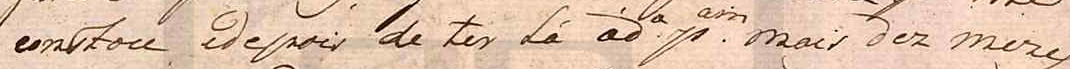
constou e depois de ter Lá a d.a p.am mais dez mezes
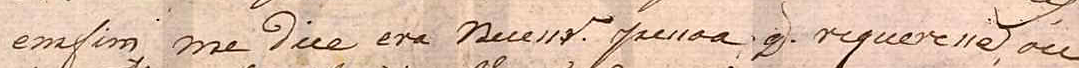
emfim me dice era necessr.o pessoa, q̄ requeresse, ou
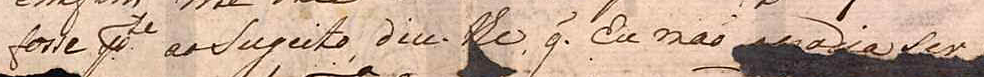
fosse pte ao sugeito, dice-lhe q̄ Eu naõ a _odia ser
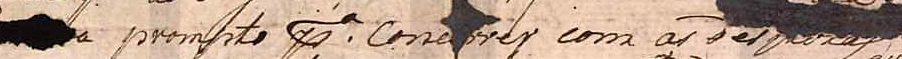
_a prompto p.a conc_rrer com as despezas
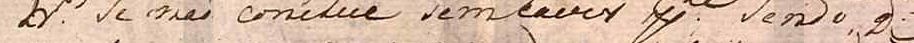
tr.os se naõ conclue sem haver p.te sendo q̄
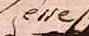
esse
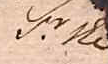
S.r lhe
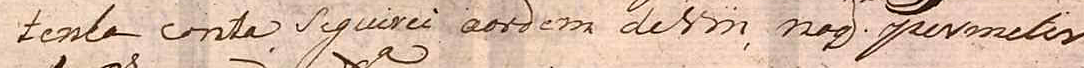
tenha conta seguirei a ordem de Vm, no q̄ permetir
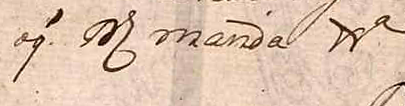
o q̄ Ds̄ manda &a
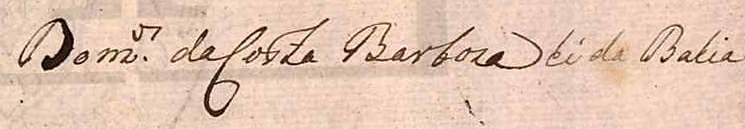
Dom.os da Costa Barboza hé da Bahia
